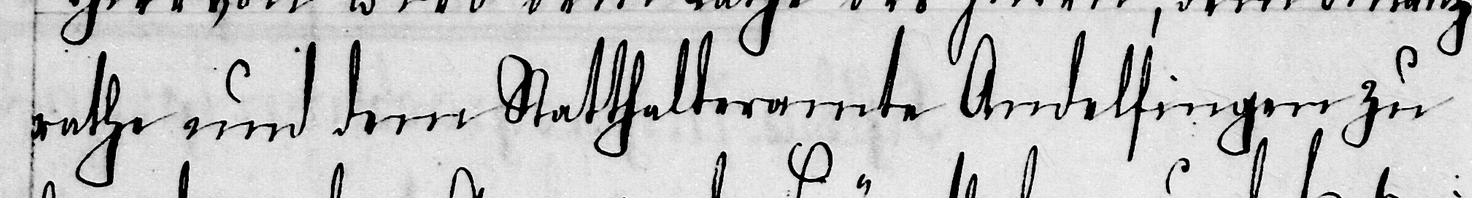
rathe und dem Statthalteramte Andelfingen zu
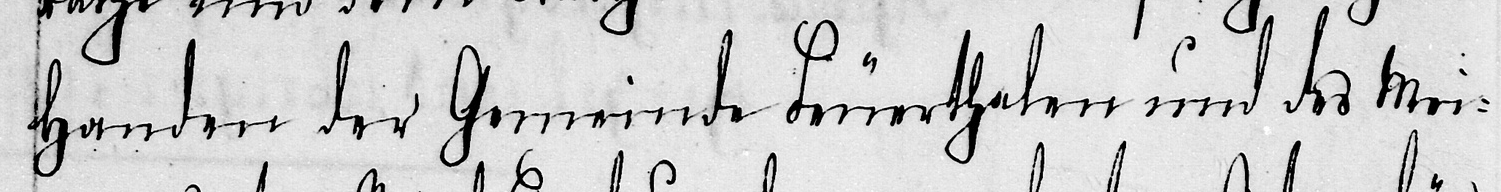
Handen der Gemeinde Feuerthalen und des Mei¬
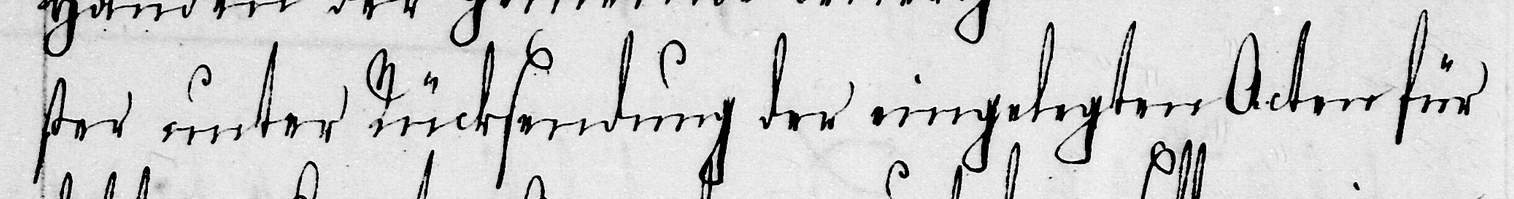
ster unter Rücksendung der eingelegten Acten für
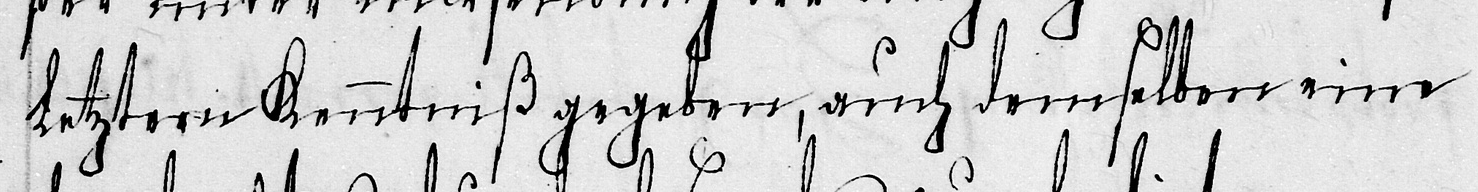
Letztern Kenntniß gegeben, auch demselben eine
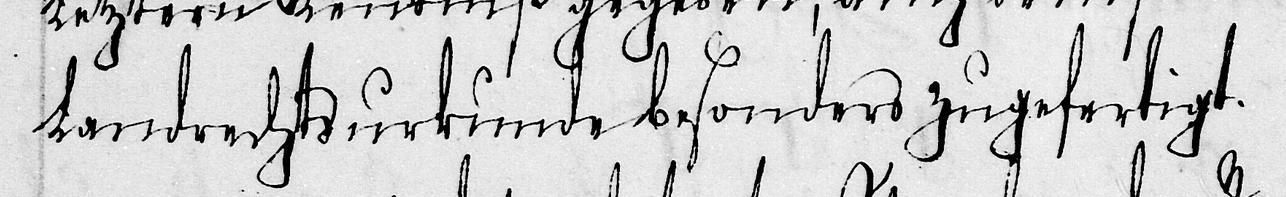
Landrechtsurkunde besonders zugefertigt.
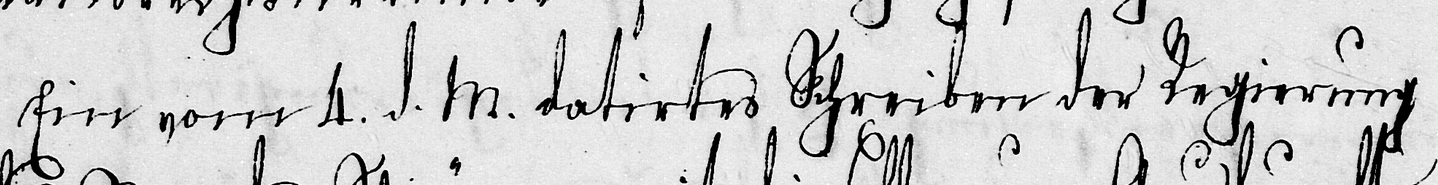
Ein vom 4. d. M. datirtes Schreiben der Regierung
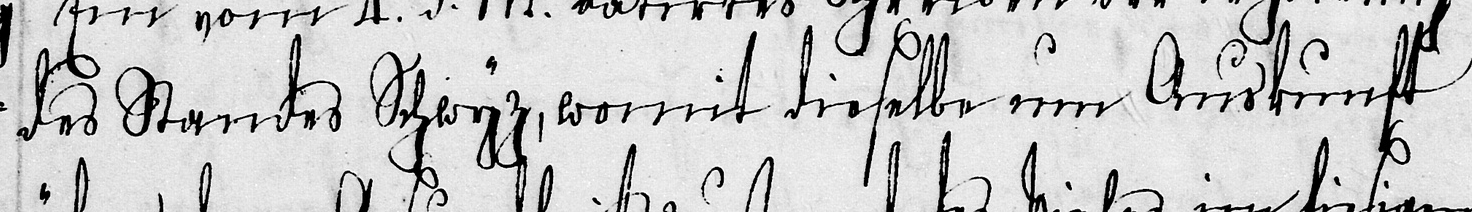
des Standes Schwyz, womit dieselbe um Auskunft
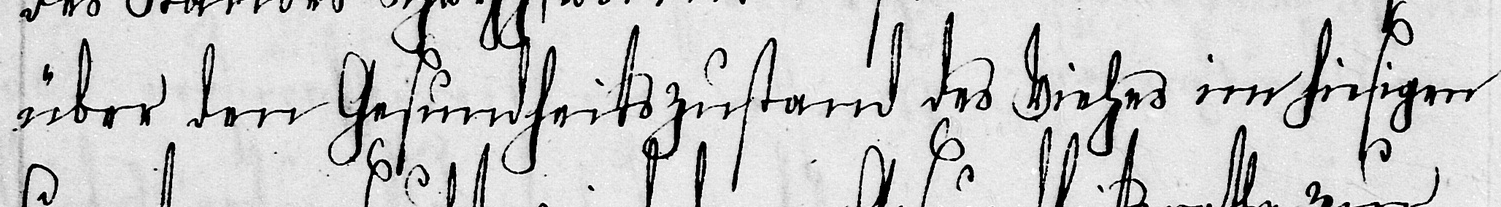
über den Gesundheitszustand des Viehes im hiesigen
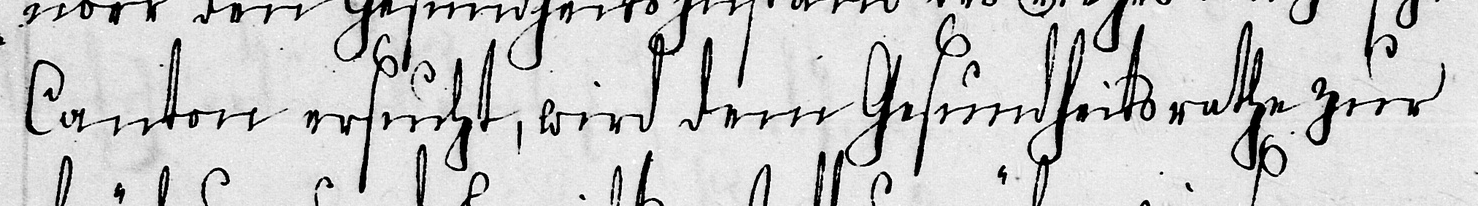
Canton ersucht, wird dem Gesundheitsrathe zur
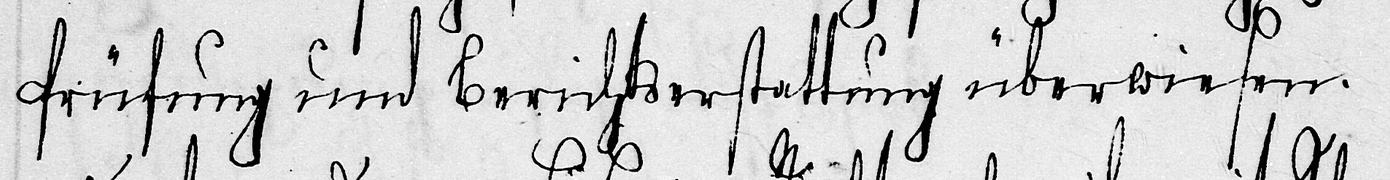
Prüfung und Berichtserstattung überwiesen.
